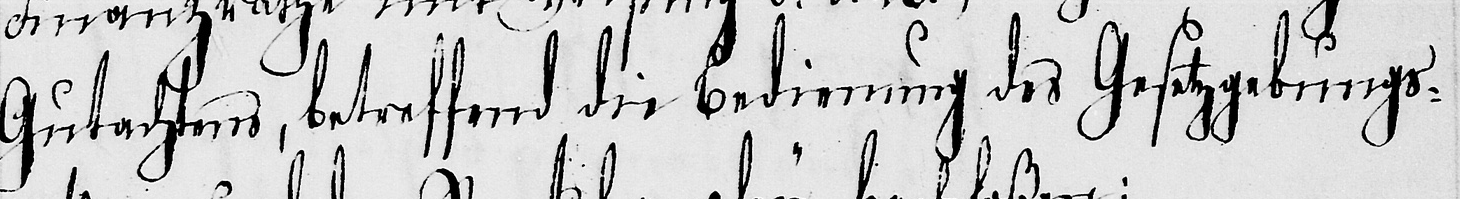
Gutachtens, betreffend die Bedienung des Gesetzgebungs¬
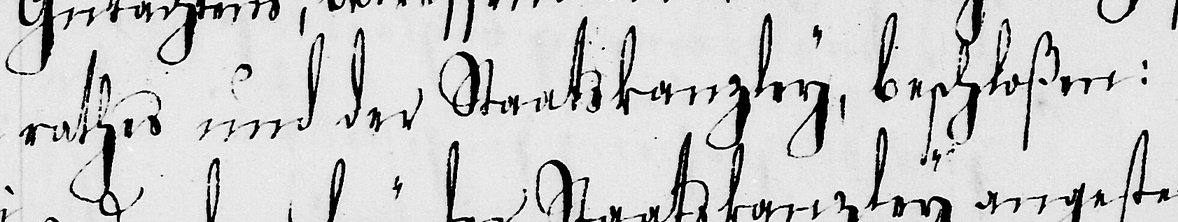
rathes und der Staatskanzley, beschloßen:
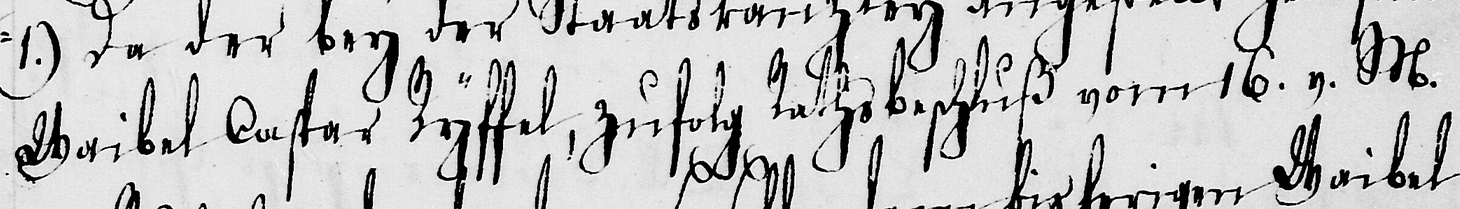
Waibel Caspar Ryffel, zufolg Rathsbeschluß vom 16. v. M.
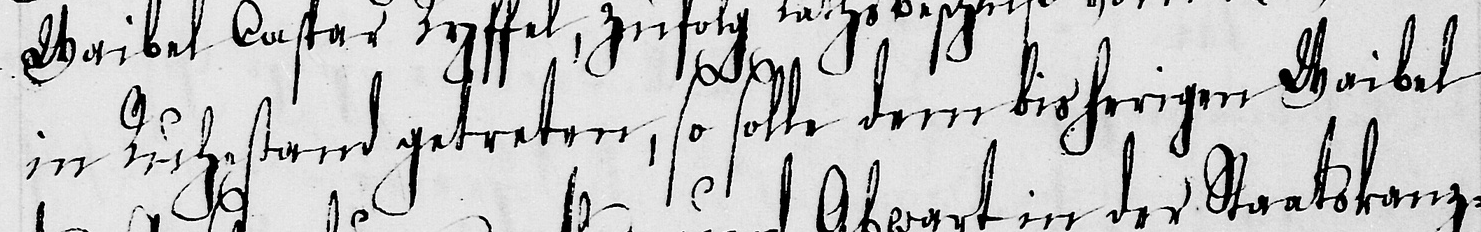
in Ruhestand getreten, so solle dem bisherigen Waibel
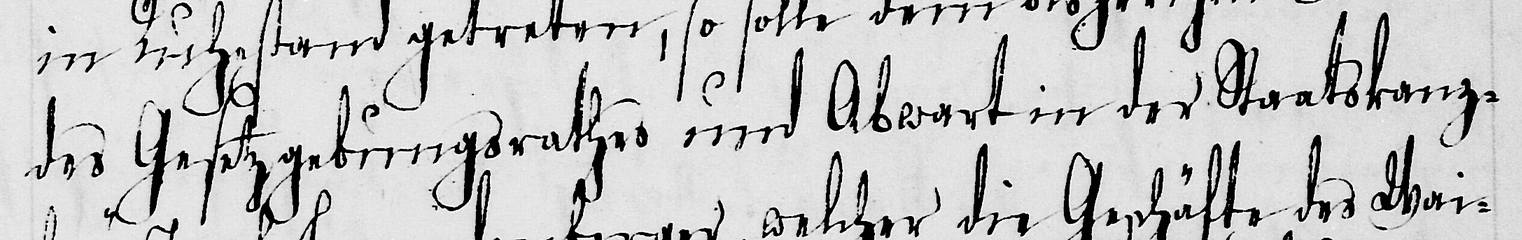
des Gesetzgebungsrathes und Abwart in der Staatskanz¬
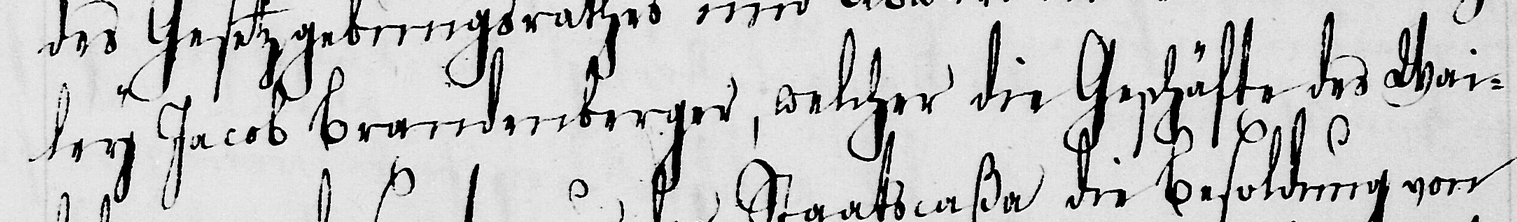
ley Jacob Brandenberger, welcher die Geschäfte des Wai¬
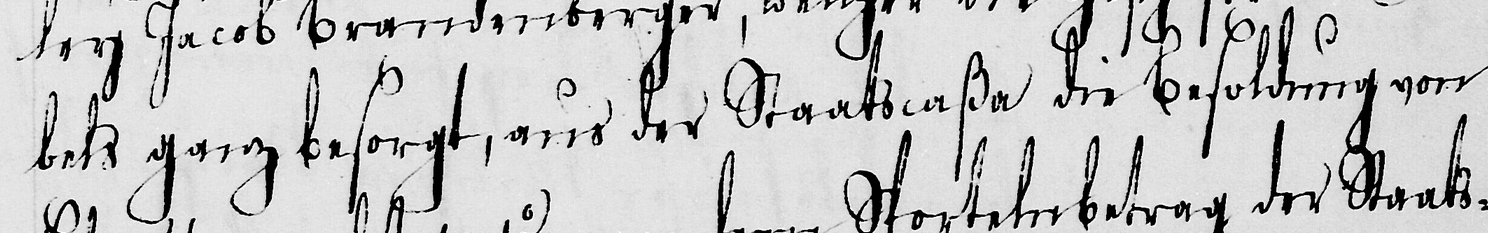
bels ganz besorgt, aus der Staatscaßa die Besoldung von
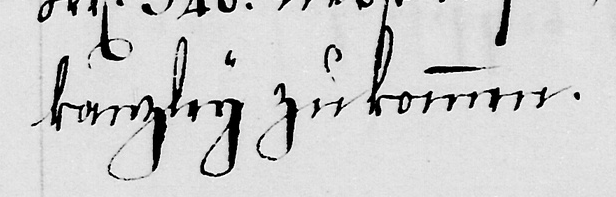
skanzley zukommen.
